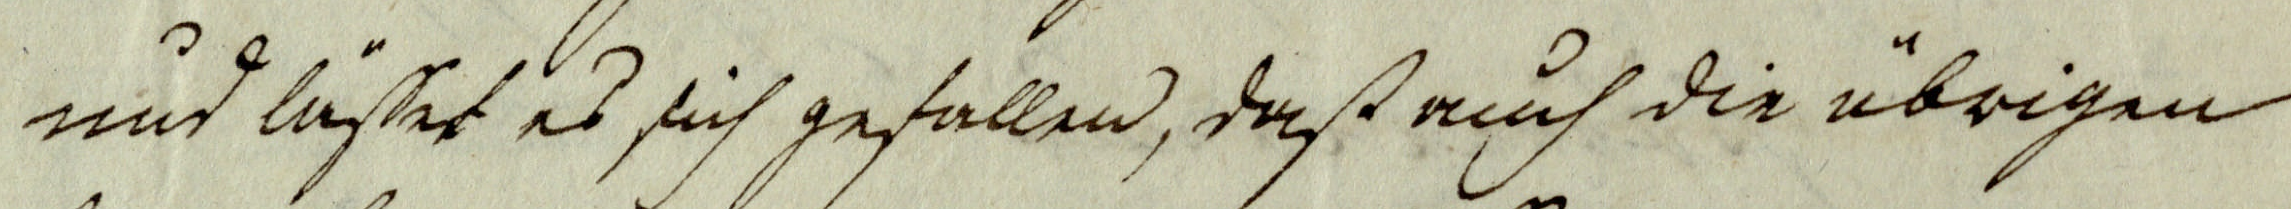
und lässet es sich gefallen, daß auch die übrigen
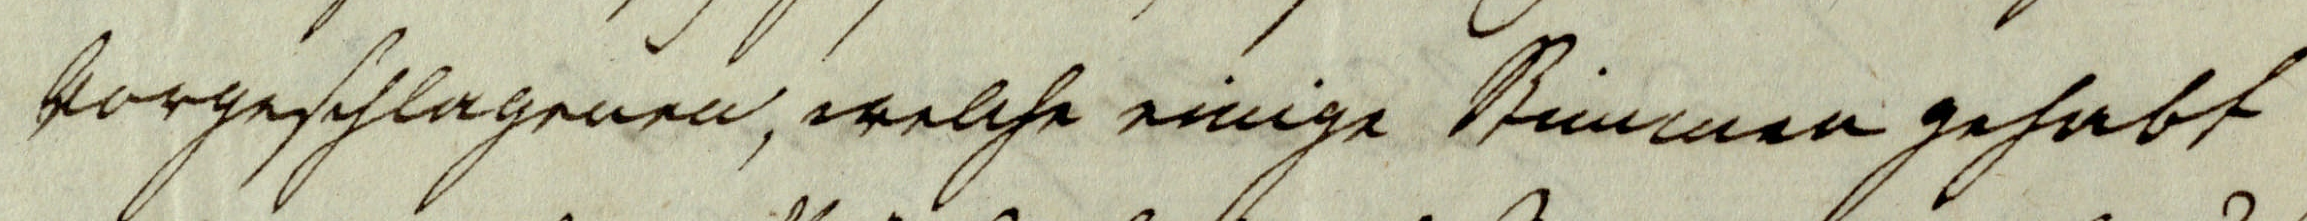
vorgeschlagenen, welche einige Stimmen gehabt
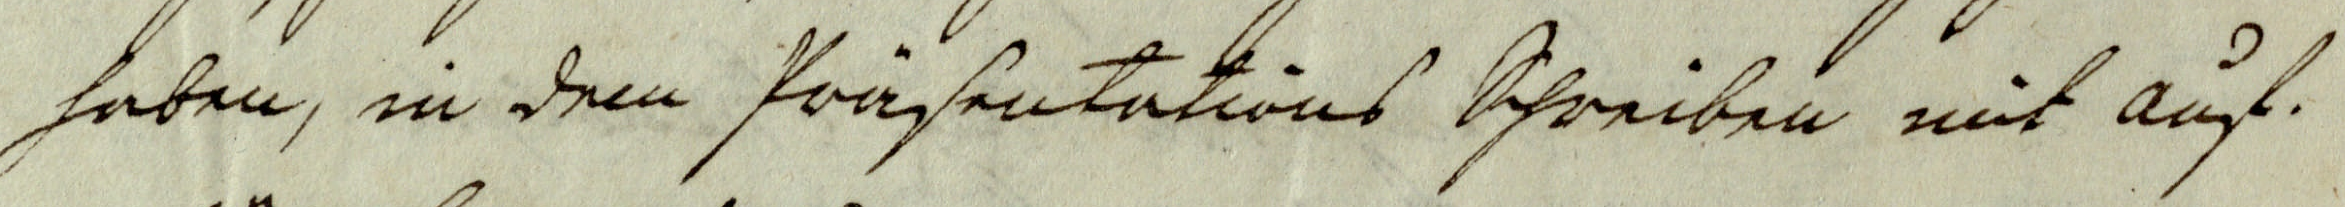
haben, in dem Präsentations Schreiben mit auf¬
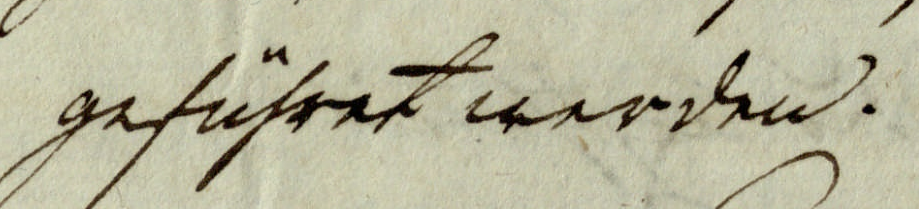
geführet werden.
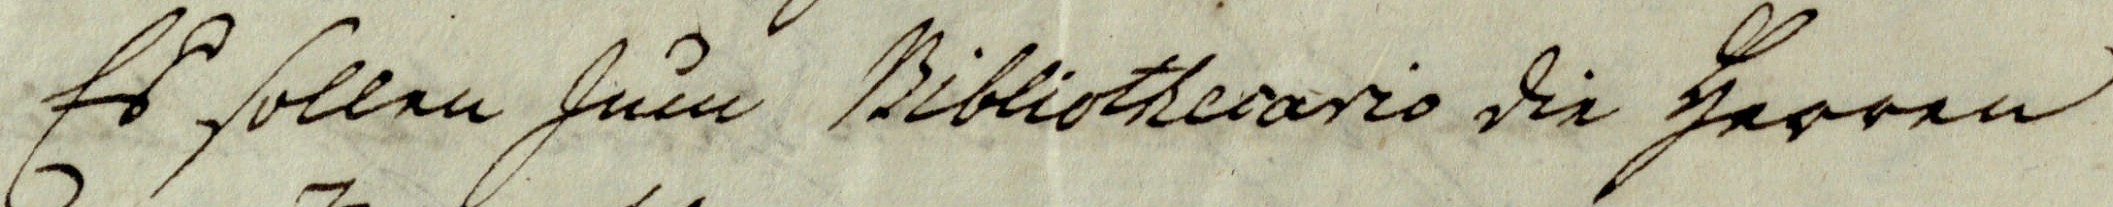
Es sollen zum Bibliothecario die Herren
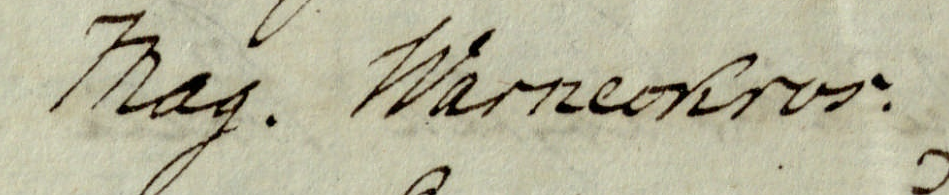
Mag. Warneckros.
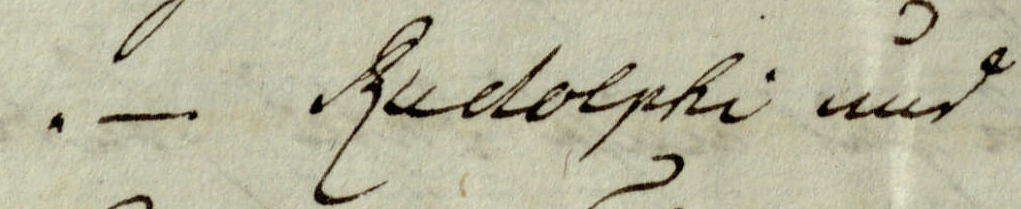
" — Rudolphi und
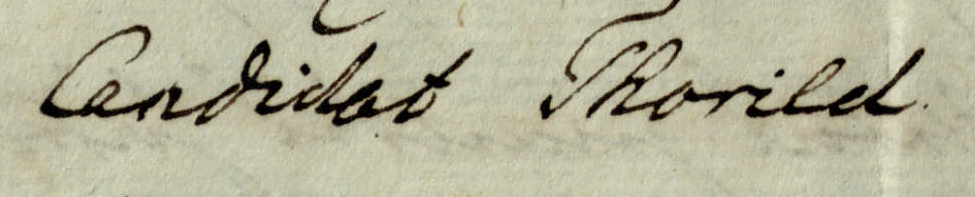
Candidat Thorild
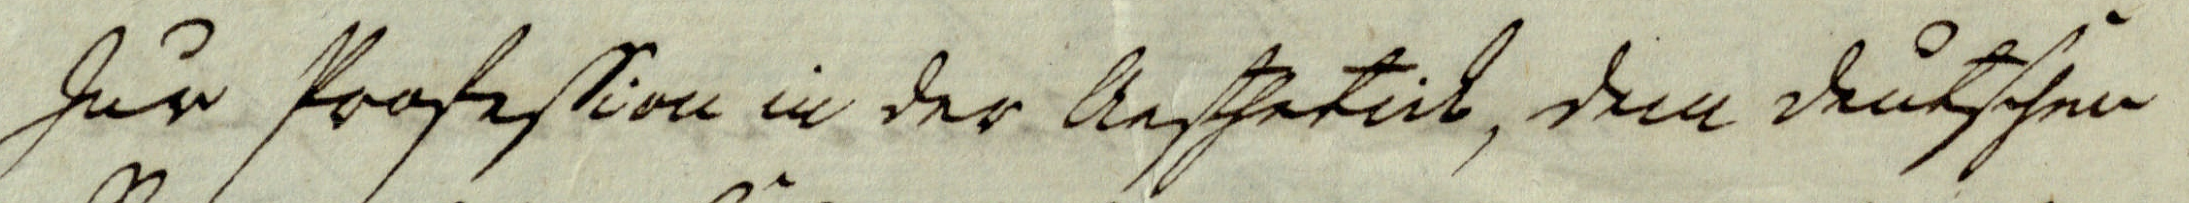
zur Profession in der Aesthetick, dem deutschen
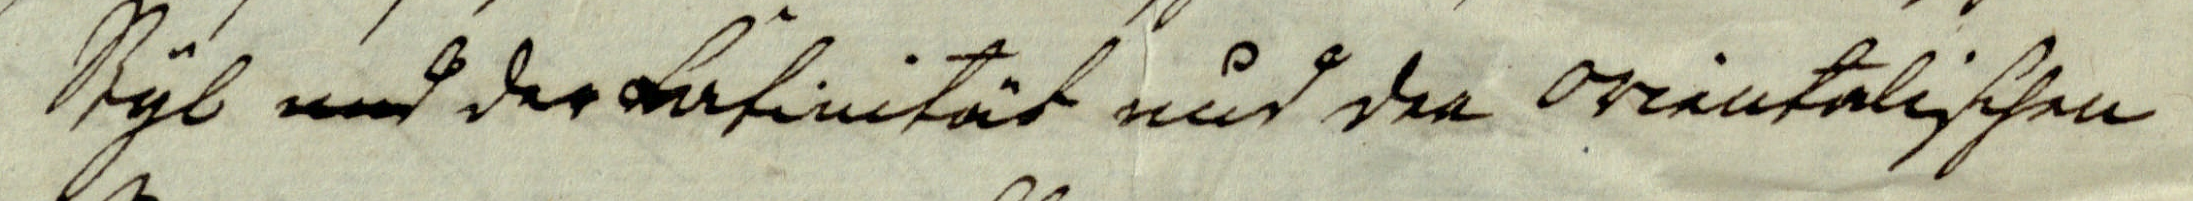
Stÿl und der Latinität und der orientalischen
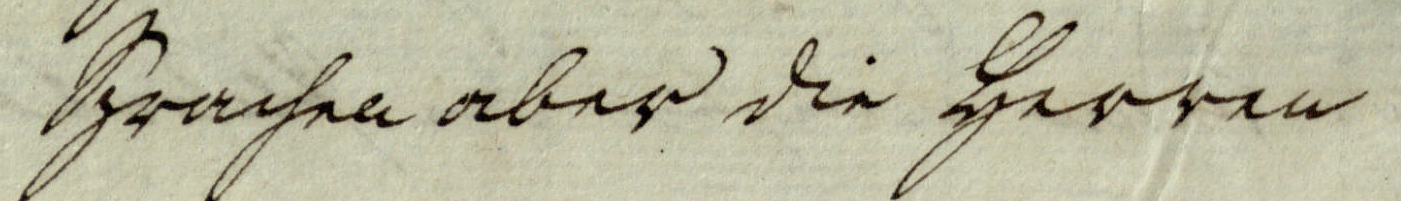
Sprachen aber die Herren
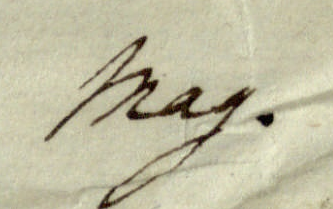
Mag.
